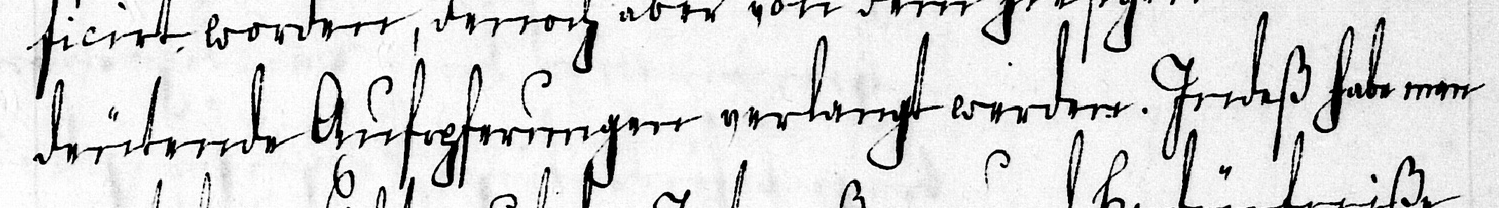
deutende Aufopferungen verlangt werden. Indeß habe man
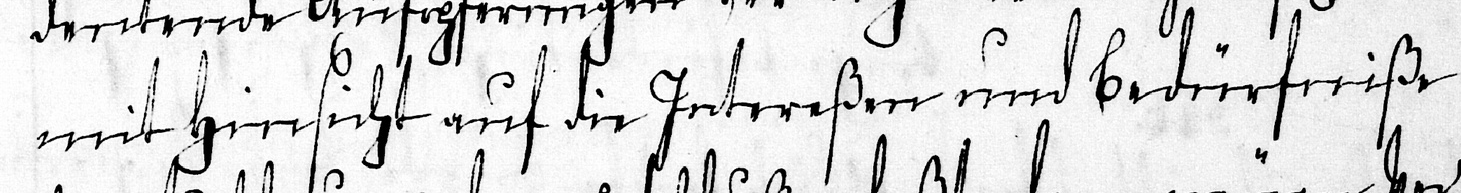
mit Hinsicht auf die Intereßen und Bedürfniße
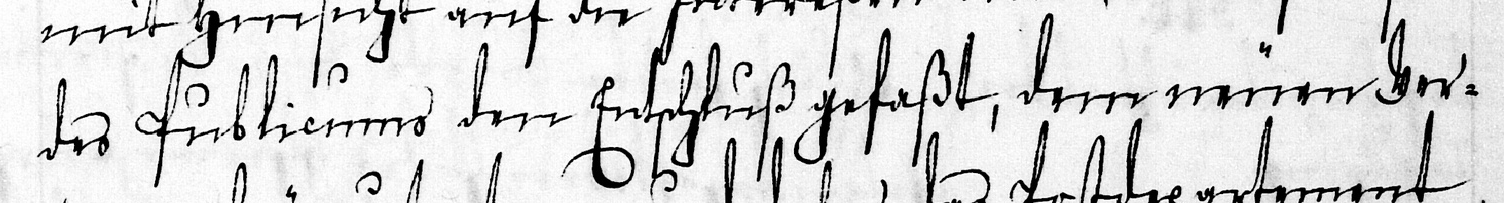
des Publicums den Entschluß gefaßt, dem neuen Ver¬
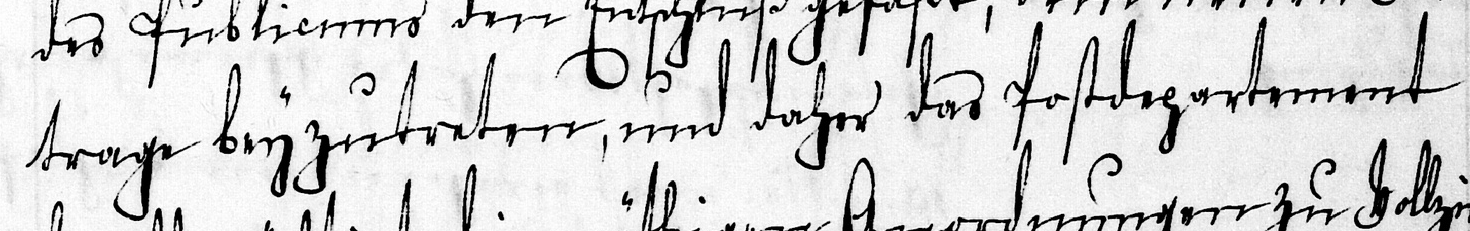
trage beyzutreten, und daher das Postdepartement
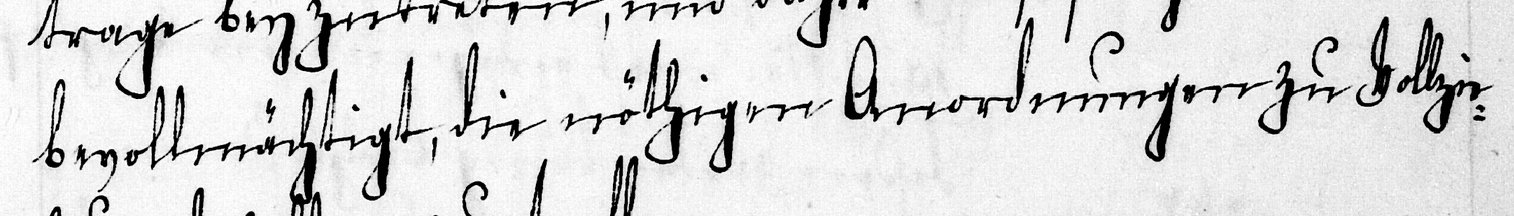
bevollmächtigt, die nöthigen Anordnungen zu Vollzi¬
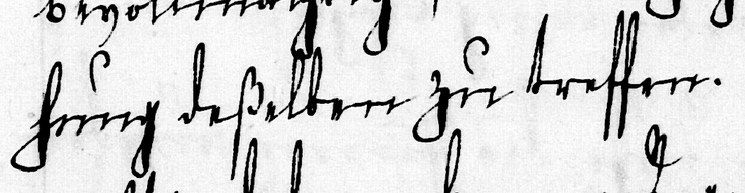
ehung deßelben zu treffen.
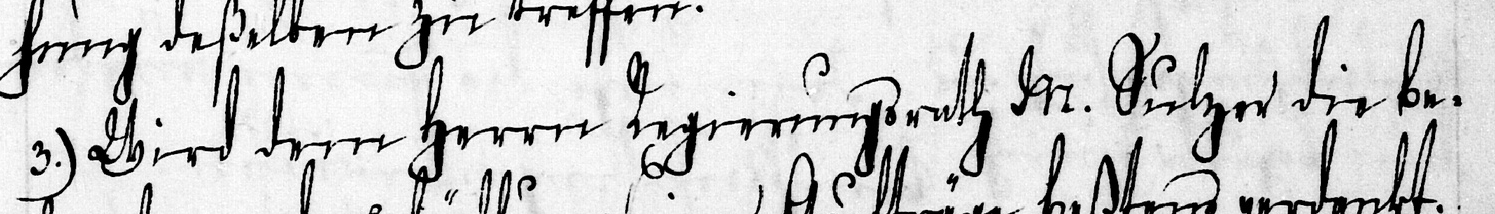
3.) Wird dem Herrn Regierungsrath M. Sulzer die be¬
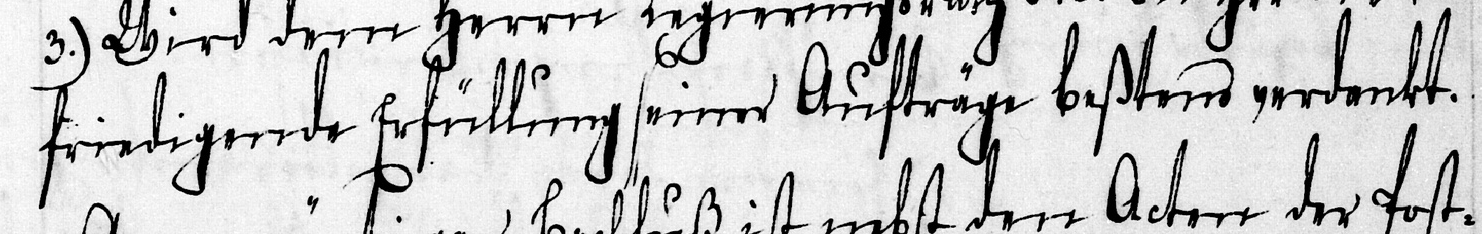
friedigende Erfüllung seiner Aufträge beßtens verdankt.
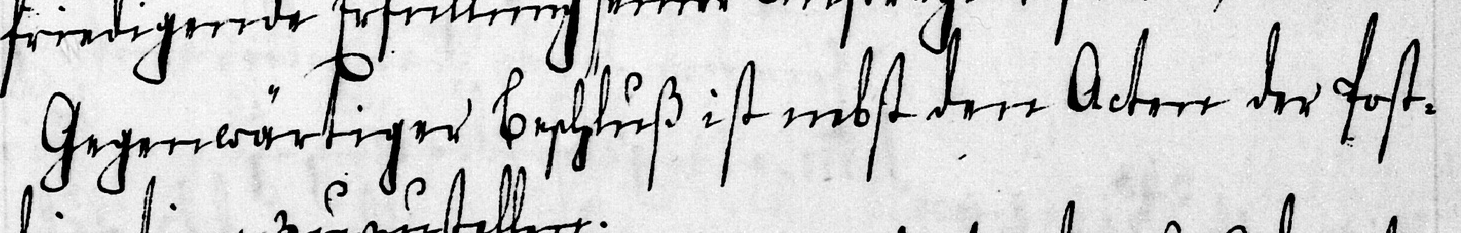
Gegenwärtiger Beschluß ist nebst den Acten der Post¬
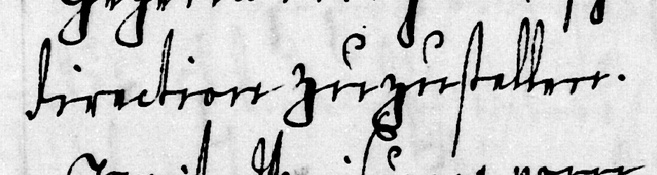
direction zuzustellen.
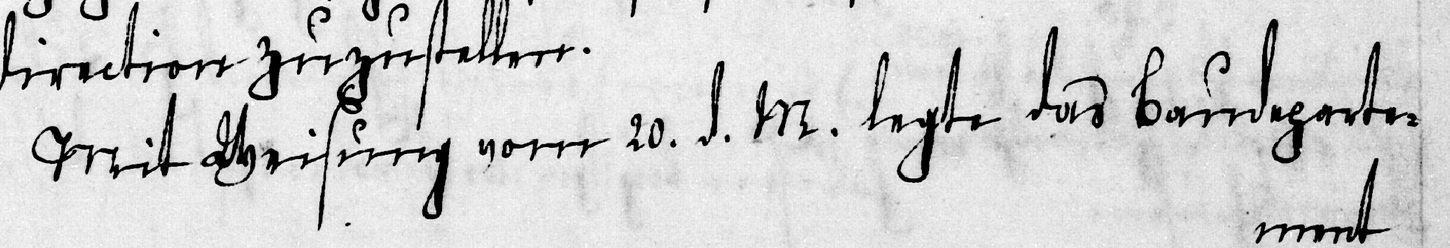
Mit Weisung vom 20. d. M. legte das Baudeparte-
